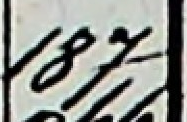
187
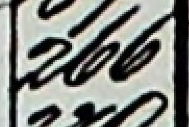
266
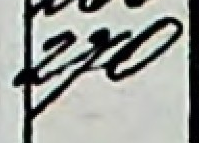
270
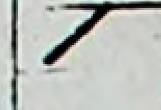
I
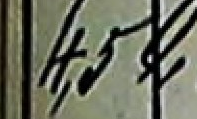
4,52
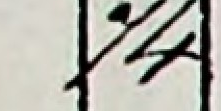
74
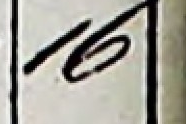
16
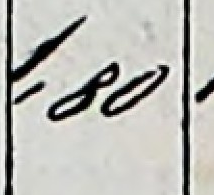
1,80
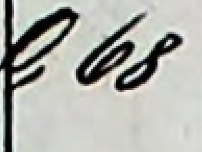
0,68
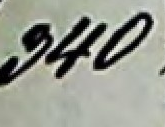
340
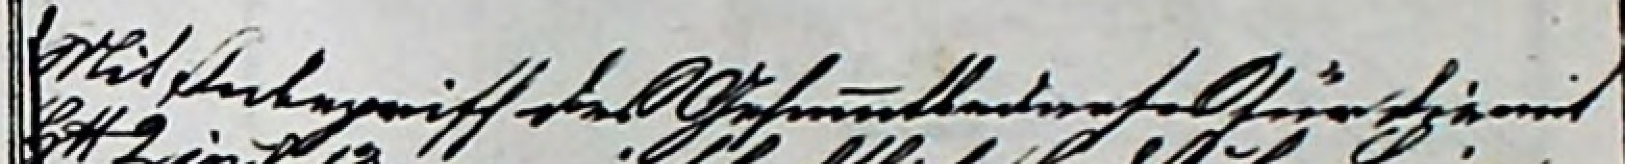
Mit Inbegriff des Gesammtbedarfes für die mit
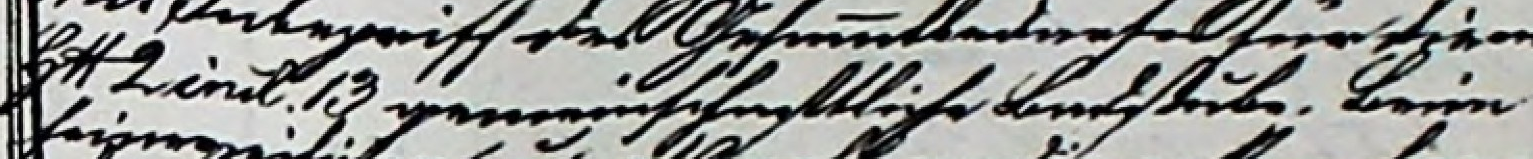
H? 2 inil. 13 gemeinschaftliche Badßube. Beim
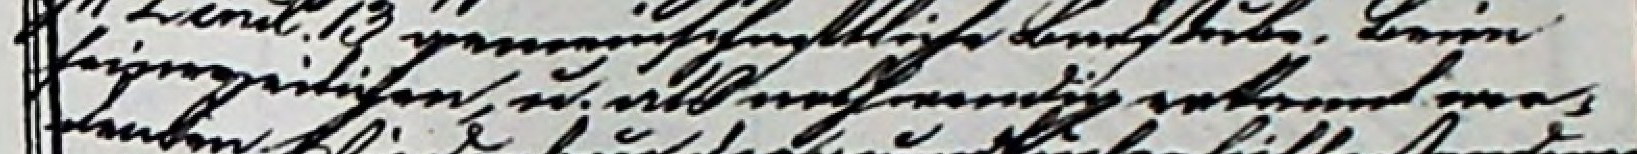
seinerzeilichen, u. als nathmendig erkannt nen„
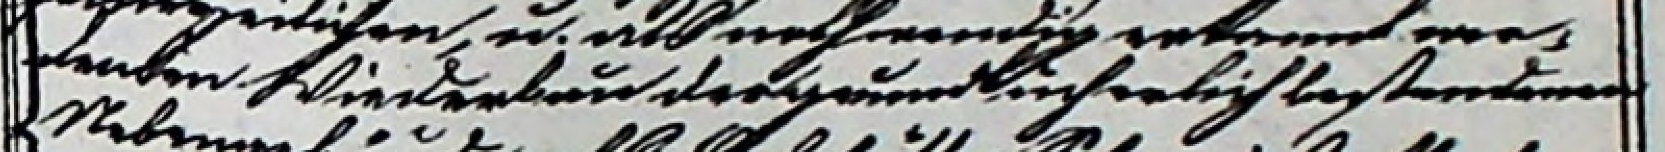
denden. Wiederbau dergaundduchenlich bestandenen
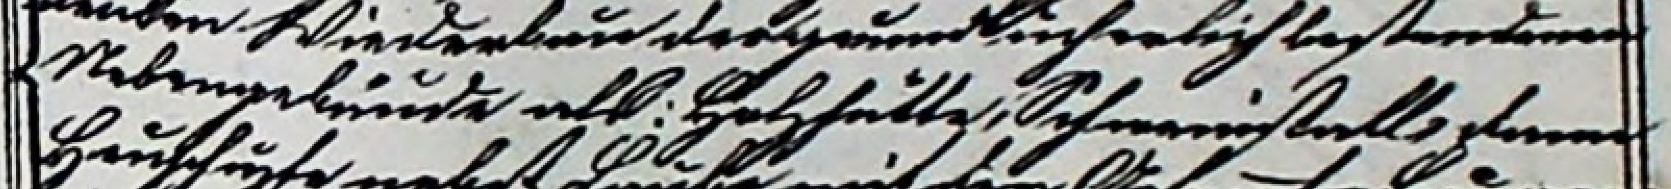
Nebengebäude als: Holzhätte, Schweinstall, dann
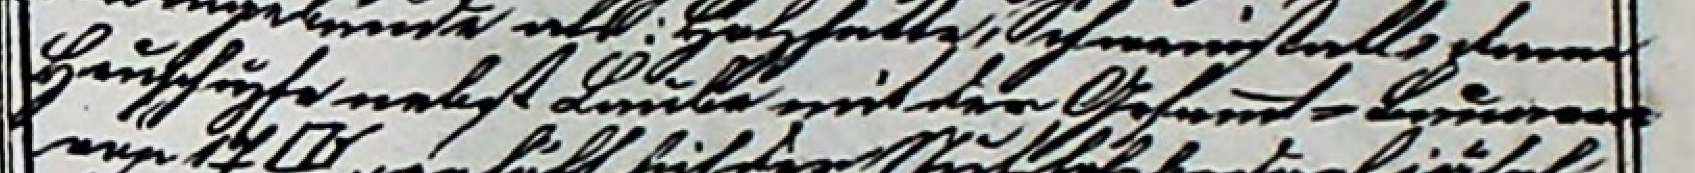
Hauschupfe nebst Laube mit der Gesammt = Bau???
